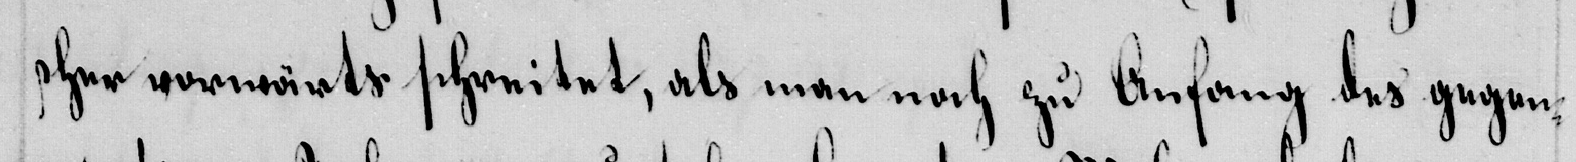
scher vorwärtsschreitet, als man noch zu Anfang des gegen¬
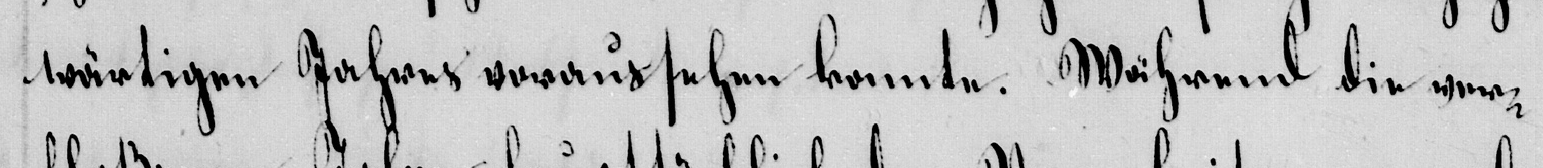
wärtigen Jahres voraussehen konnte. Während die ver¬
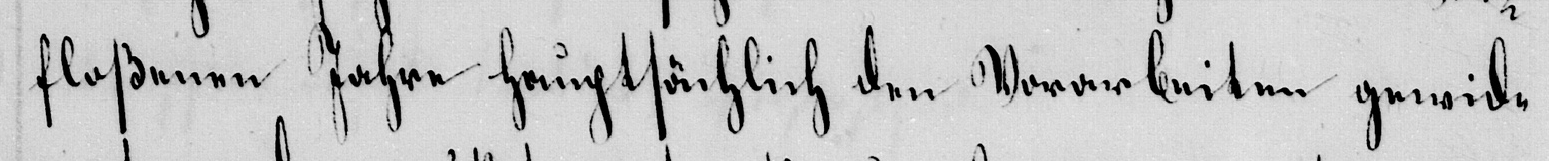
floßenen Jahre hauptsächlich den Vorarbeiten gewid¬
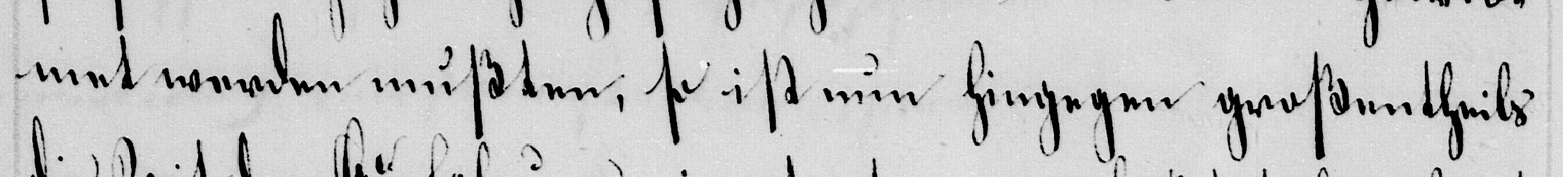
met werden mußten, so ist nun hingegen großtentheils
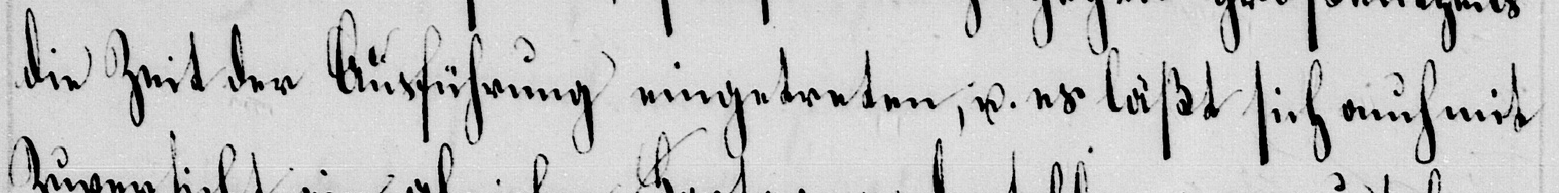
die Zeit der Ausführung eingetreten, u. es läßt sich auch mit
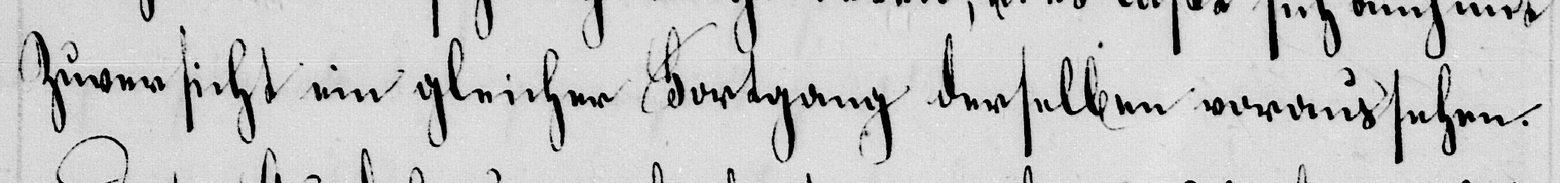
Zuversicht ein gleicher Fortgang derselben voraussehen.
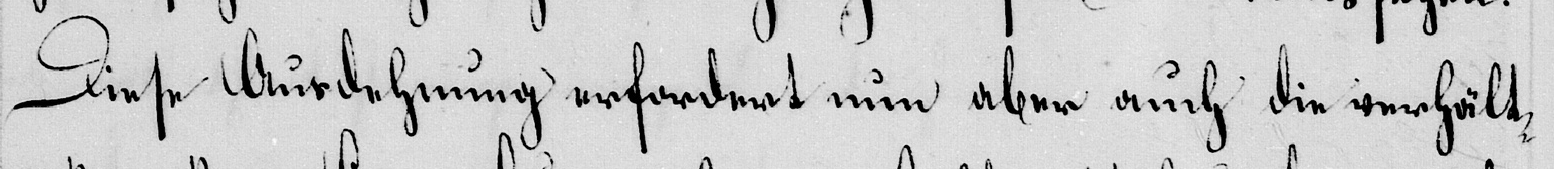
Diese Ausdehnung erfordert nun aber auch die verhält¬
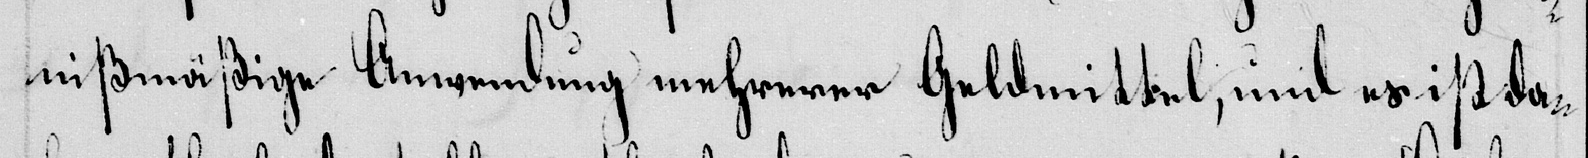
nißmäßige Anwendung mehrerer Geldmittel, und es ist da¬
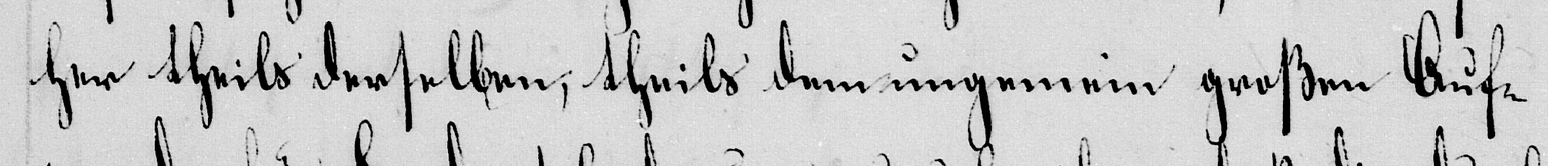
her theils derselben, theils dem ungemein großen Auf¬
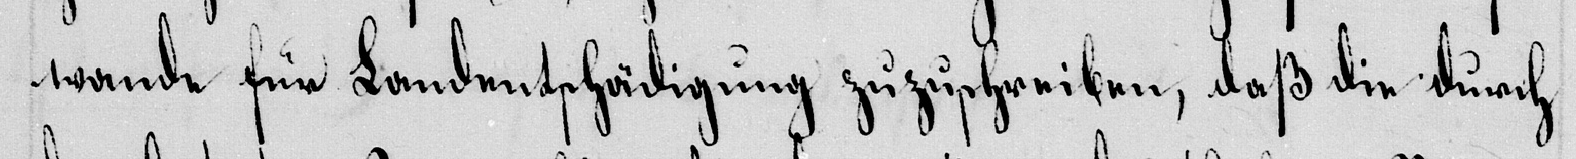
wande für Landentschädigung zuzuschreiben, daß die durch
